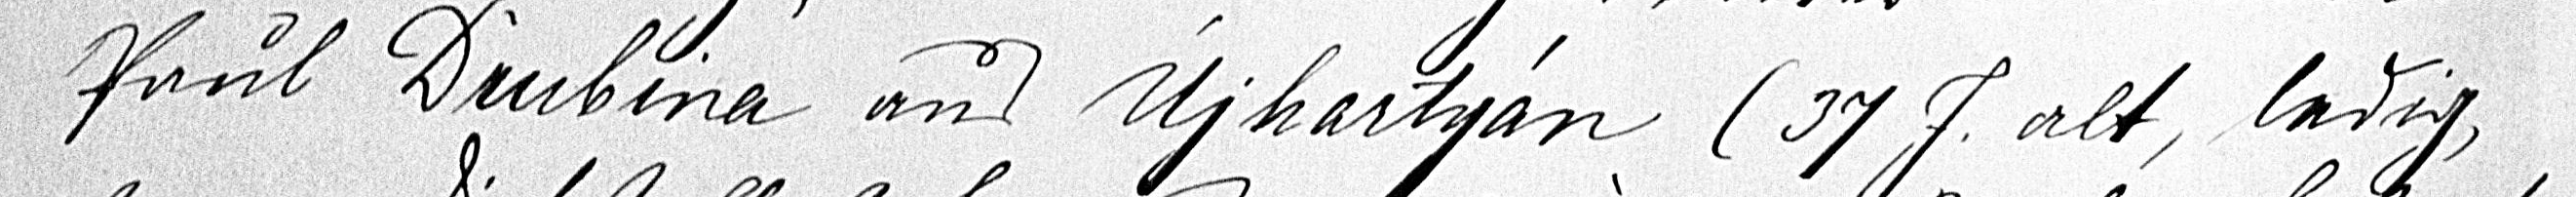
Paul Drubina aus Újhartyán (37 J. alt, ledig,
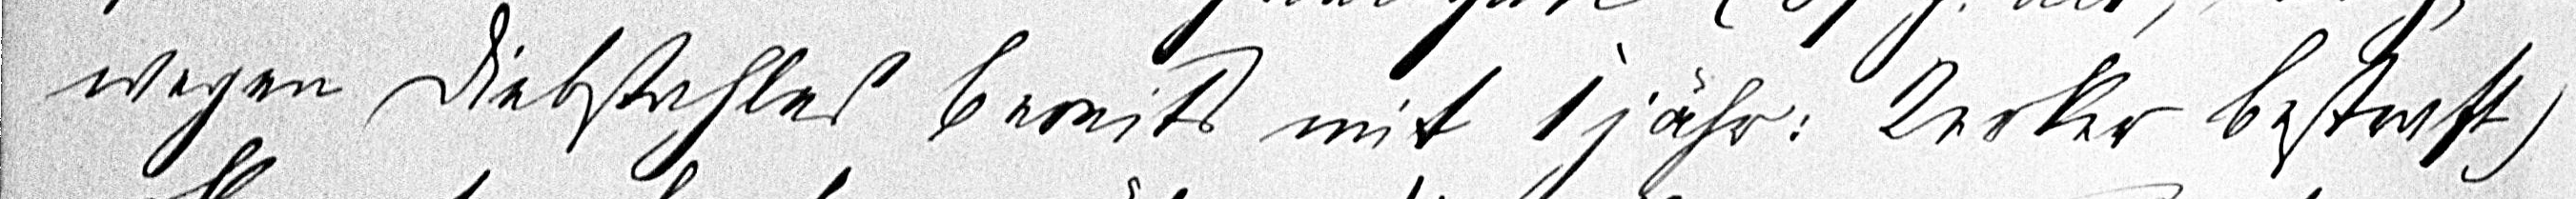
wegen Diebstahles bereits mit 1jähr: Kerkerbestraf)
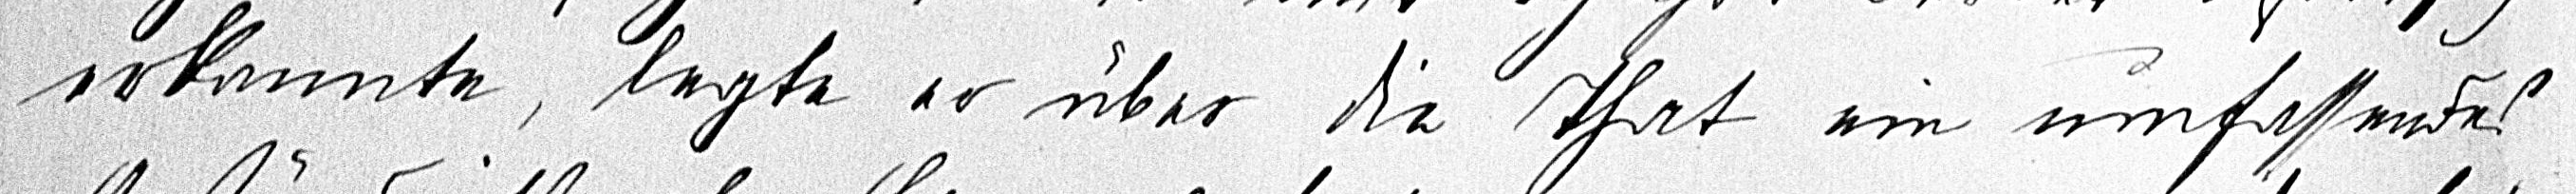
erkannte, legte er über die That ein umfassendes
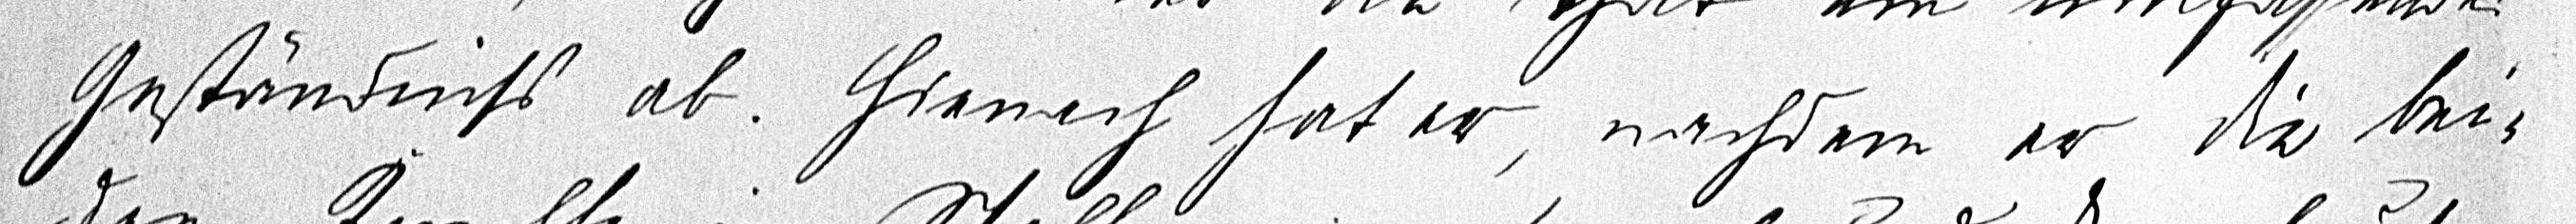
Geständnis ab.Hienach hat er, nachdem er die bei¬
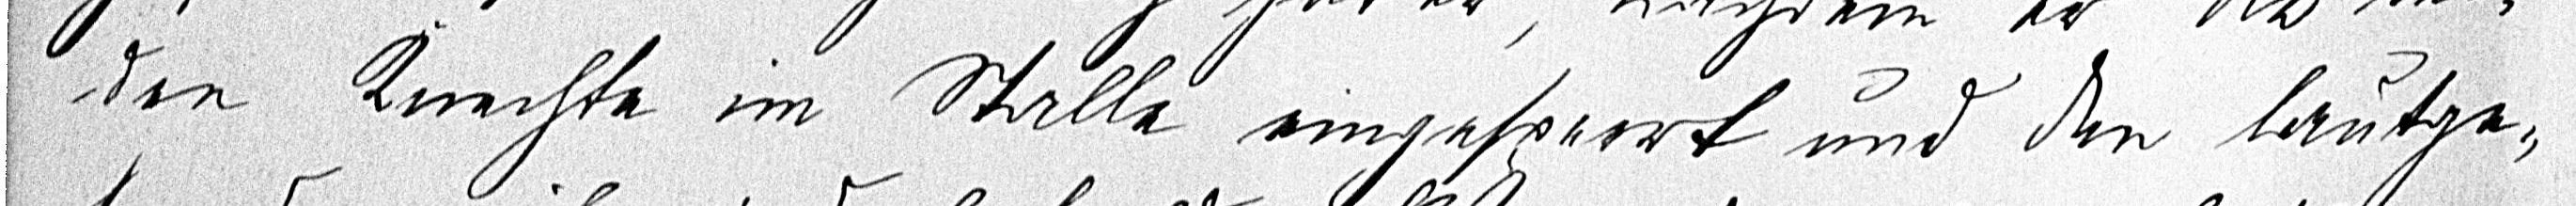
den Knechte im Stalle eingesperrtund den lautge¬
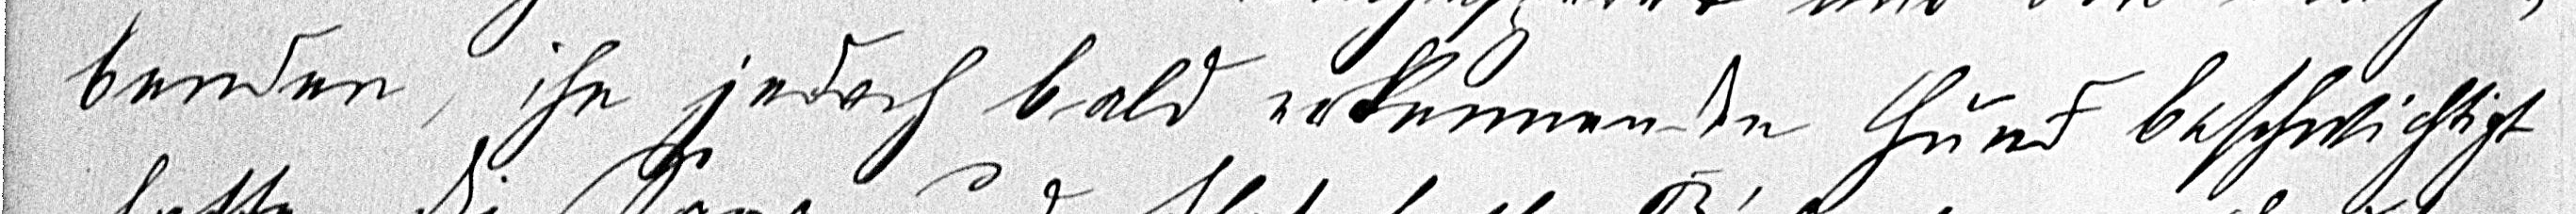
benden, ihn jedoch bald erkennenden Hund beschwichtigt
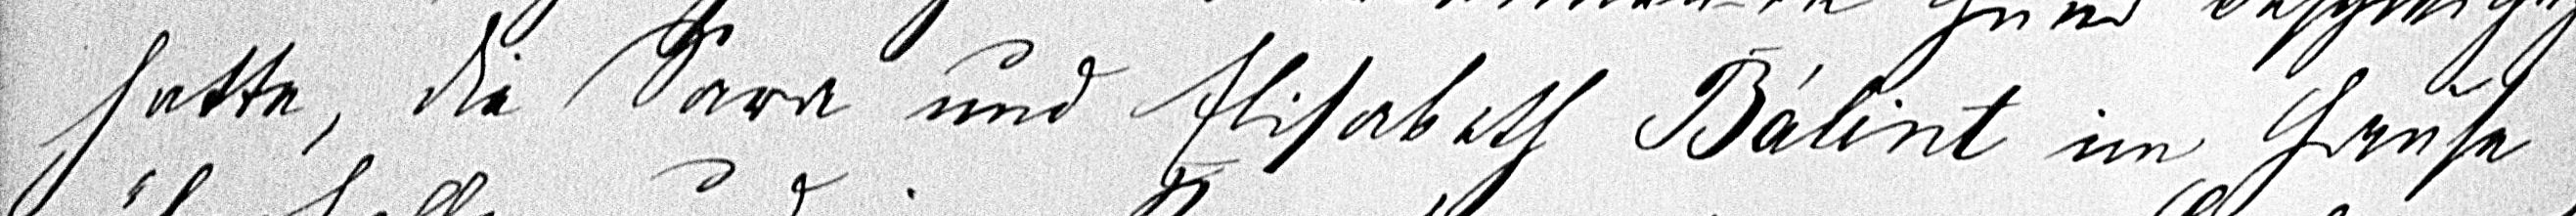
hatte, die Sara und Elisabeth Bálint im Hause
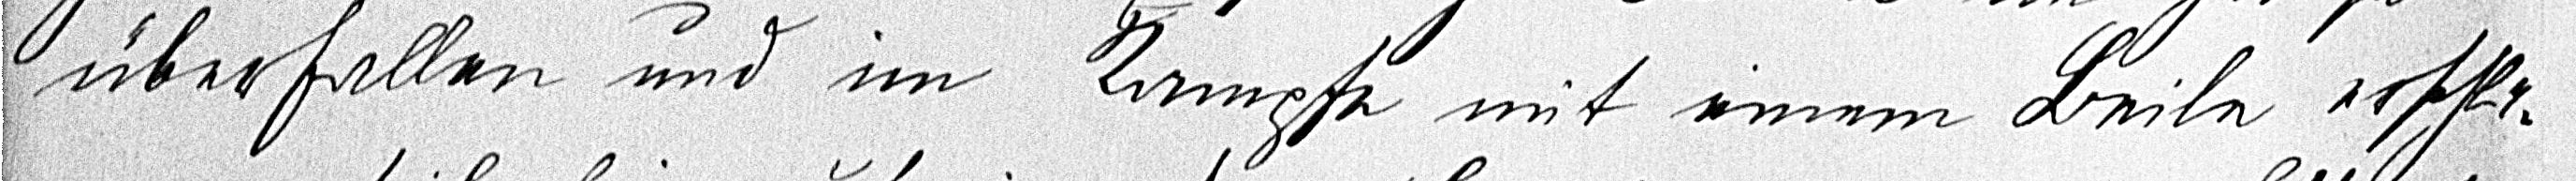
überfallen und im Kampfe mit einem Beile erschla¬
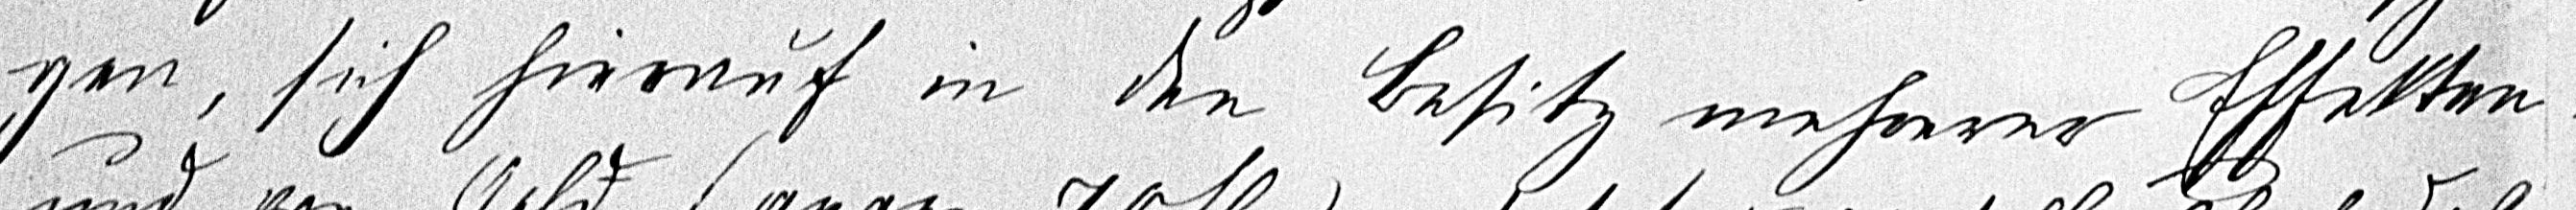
gen, sich hierauf in den Besitz mehrerer Effekten
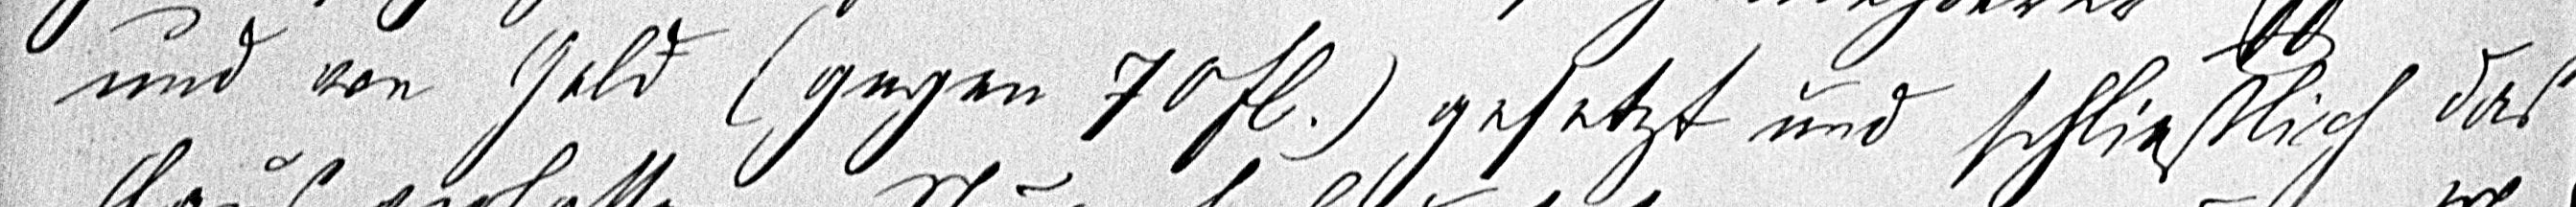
und von Geld (gegen 70 fl.) gesetzt und schließlich das
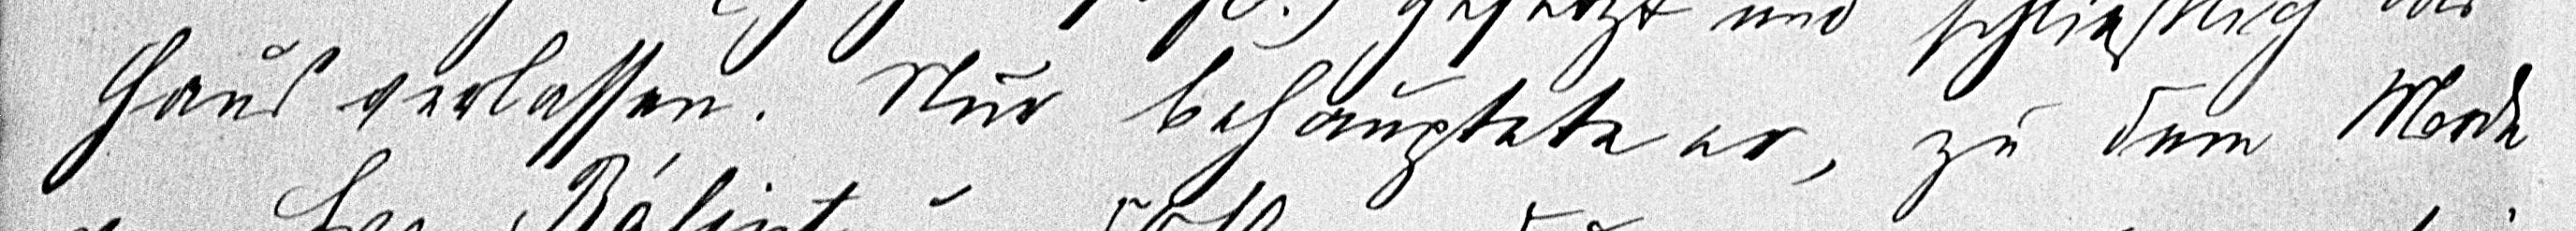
Haus verlassen. Nur behauptete er, zu dem Morde
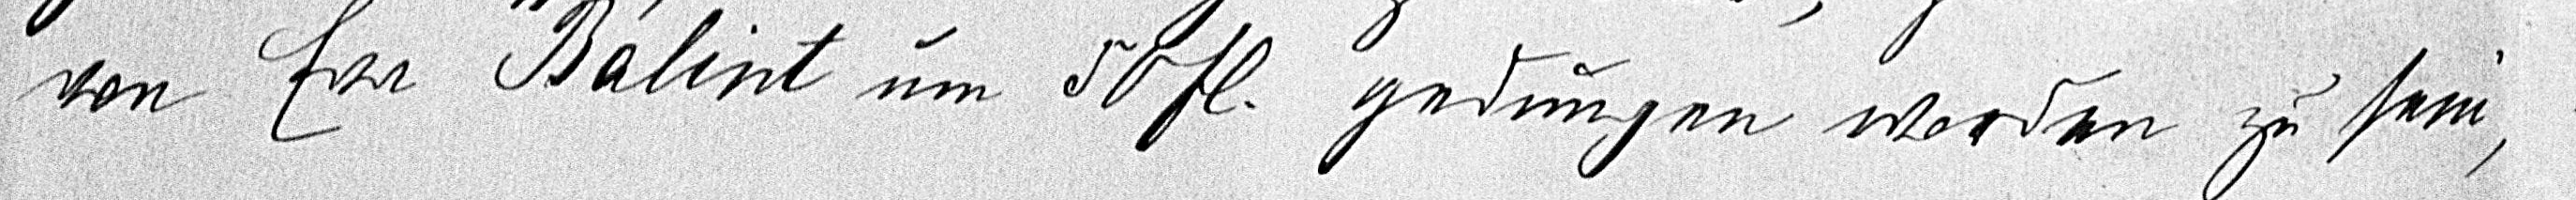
von Eva Bálint um 50 fl. gedungen werden zu sein,
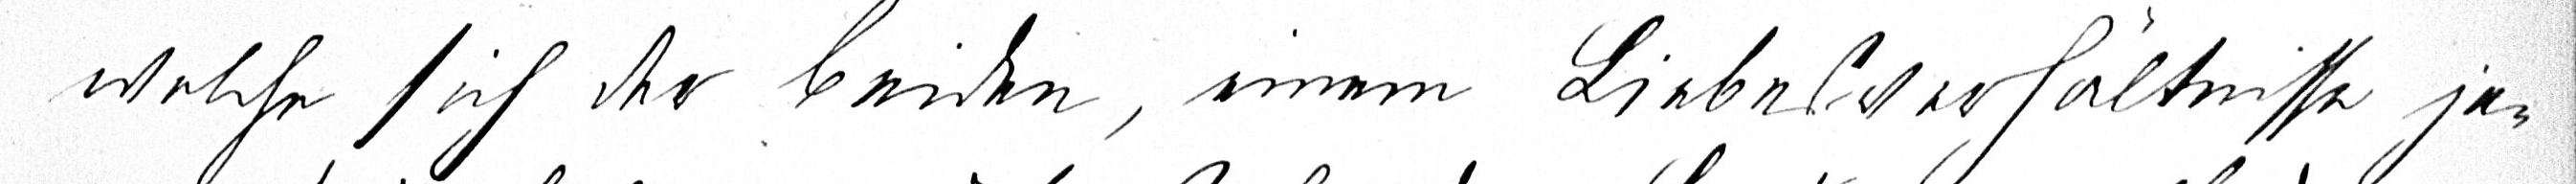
welche sich der beiden, einem Liebesverhältnisse je¬
